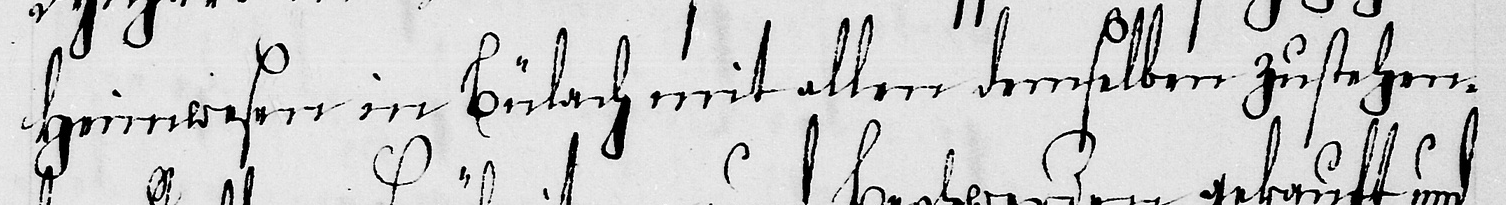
Heimwesen in Bülach mit allen demselben zustehen¬
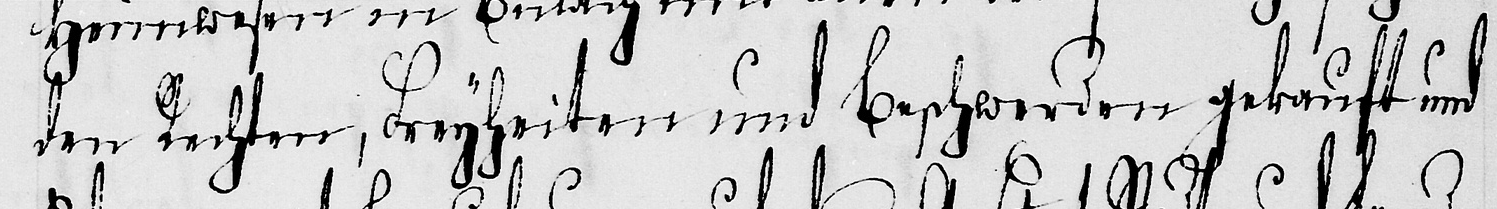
den Rechten, Freyheiten und Beschwerden gekauft und
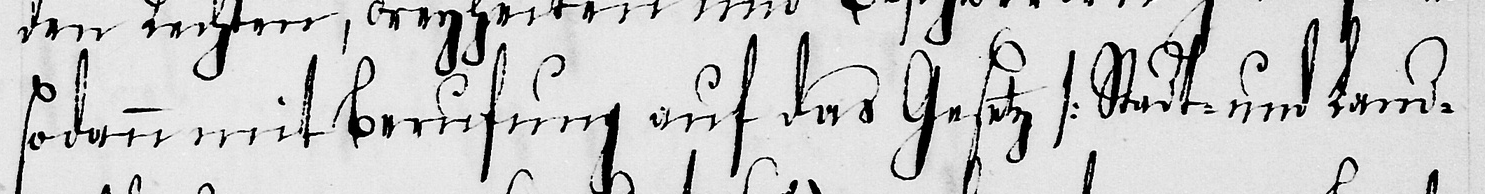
sodann mit Berufung auf das Gesetz [Stadt- und Land¬
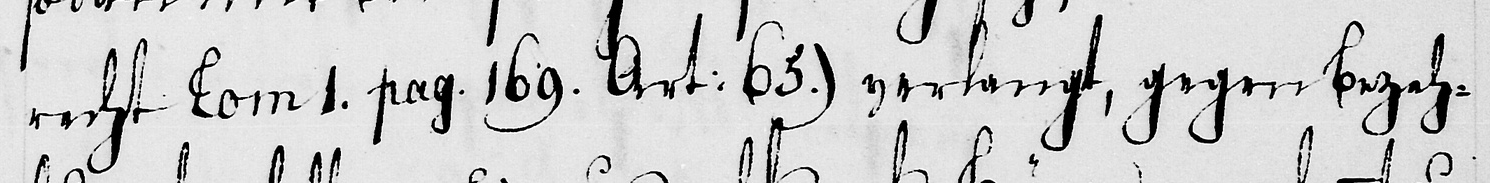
recht Tom 1. pag. 169. Art: 65.) verlangt, gegen Bezah¬
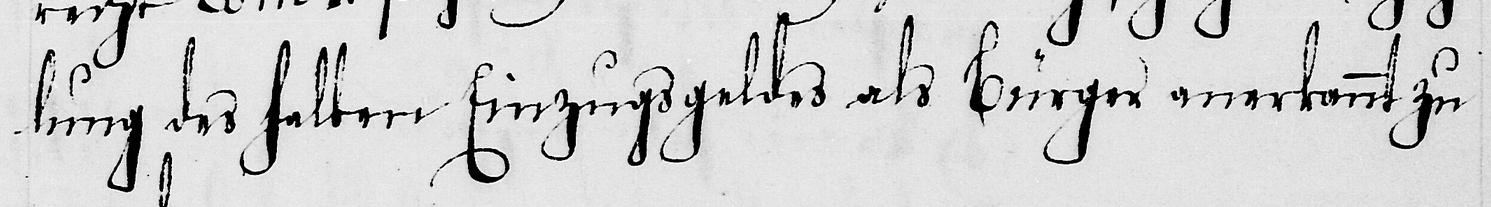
lung des halben Einzugsgeldes als Bürger anerkannt zu
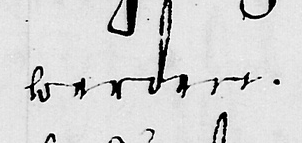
werden.
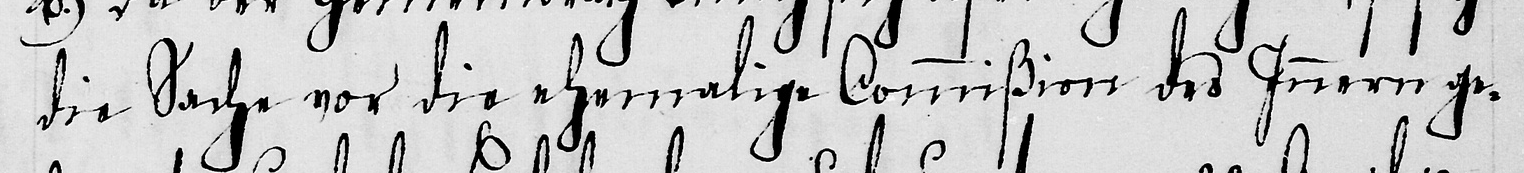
die Sache vor die ehemalige Commißion des Innern ge¬
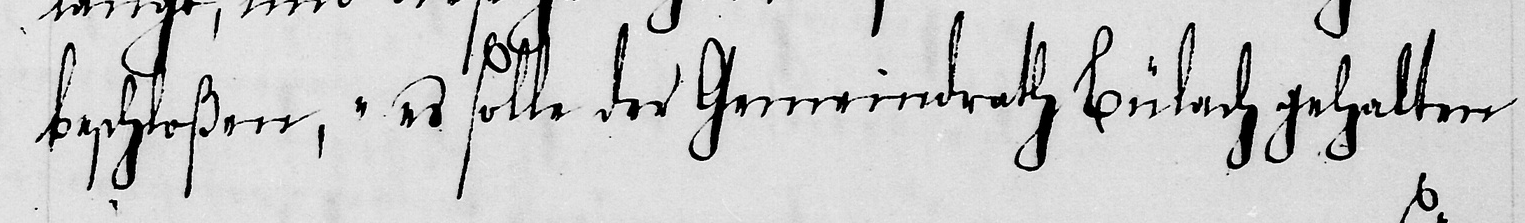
beschloßen, „es solle der Gemeindrath Bülach gehalten
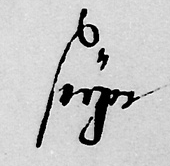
sey
